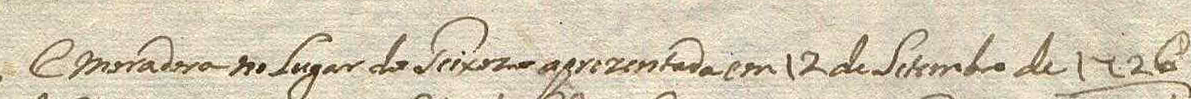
e moradora no Lugar do Teixozo aprezentada em 12 de Setembro de 1726
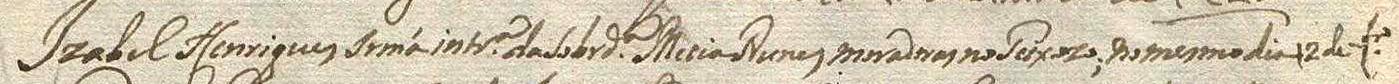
Izabel Henriques Irmā intr.a da Sobrd.a Mecia Nunes moradoras no Teixozo, no mesmo dia 12 de 7.bro
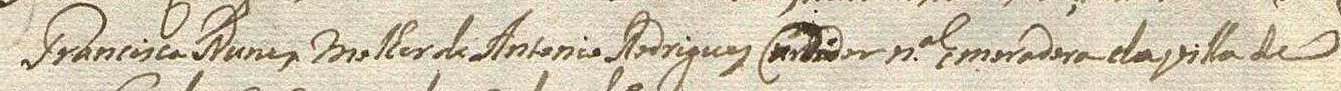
Francisca Nunes molher de Antonio Rodrigues Cortidor n.al E moradora da villa de
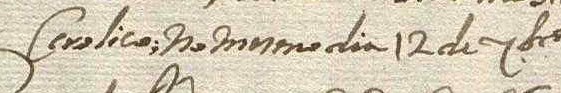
Cerolico, no mesmo dia 12 de 7.bro
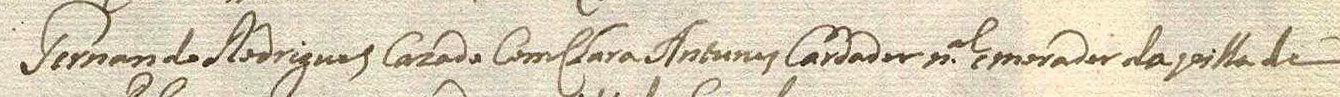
Fernando Rodrigues Cazado Com Clara Antunes Cardador n.al e morador da villa de
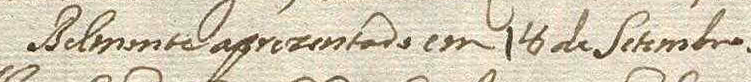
Belmonte aprezentado em 14 de Setembro.
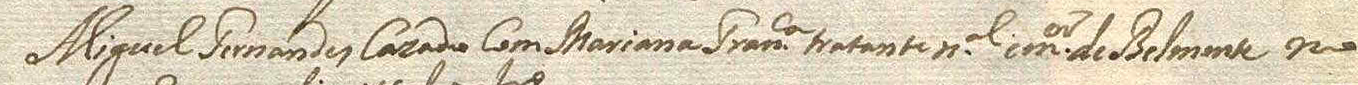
Miguel Fernandes Cazado Com Mariana Fran.ca tratante n.al e m.or de Belmonte no
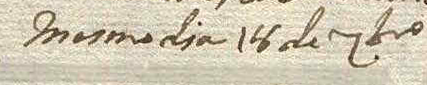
mesmo dia 14 de 7.bro
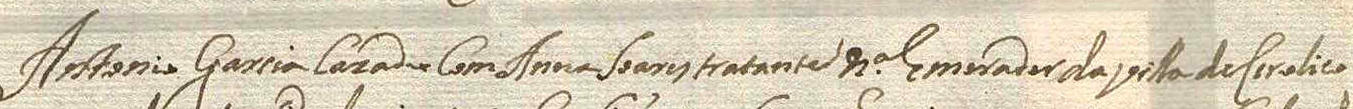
Antonio Garcia Cazado Com Anna Soares tratante n.al e morador da villa de Cerolico
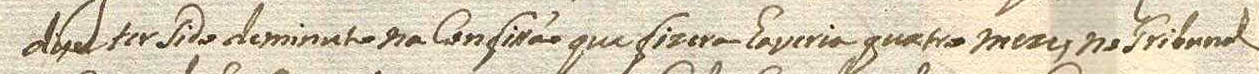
dise ter sido deminuto na Confissão que fizera haveria quatro mezes no Tribunal
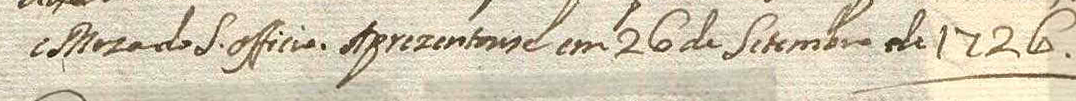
e Meza do S. officio. Aprezentouse em 26 de Setembro de 1726.
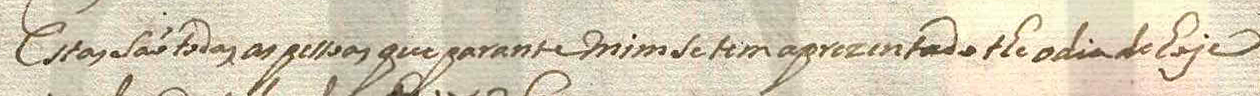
Estas saõ todas as pessoas que parante mim se tem aprezentado the o dia de hoje
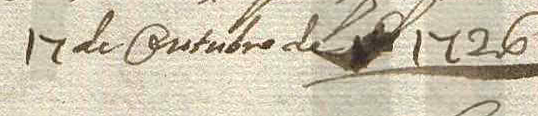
17 de Outubro de 1726
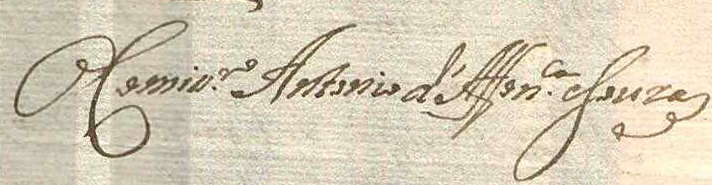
O Comiss.ro Antonio d'Affon.ca e Souza
